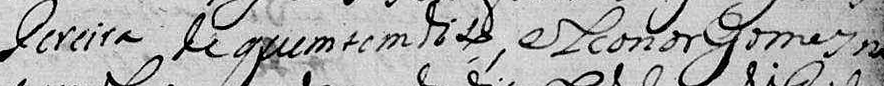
Pereira de quem tem dito, e Leonor Gomes na
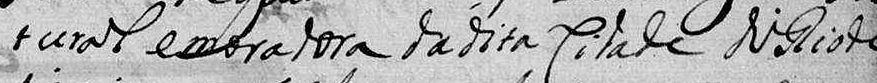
tural e moradora da dita Cidade do Rio de
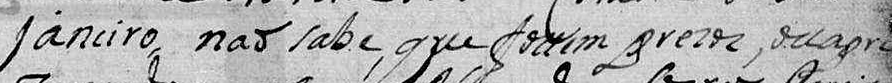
Janeiro, naõ sabe que fossem prezoz, ou apre
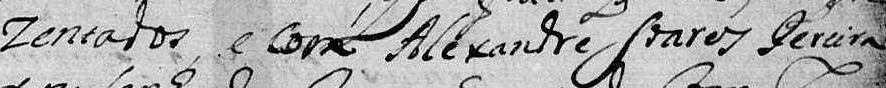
zentados, e com Alexandre soares Pereira
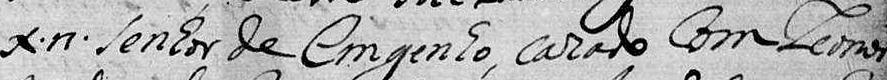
x. n. senhor de Emgenho, cazado Com Leonor
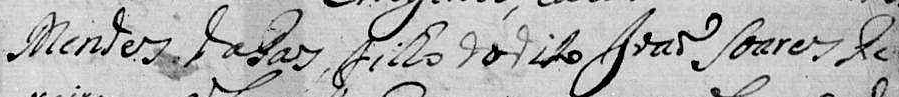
Mendes da Pas, filho do dito Joaõ Soares Pe
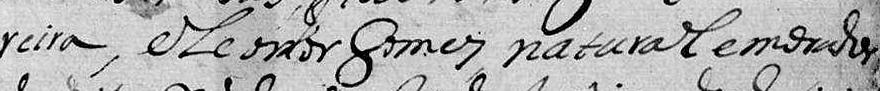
reira, e Leonor Gomes natural e morador
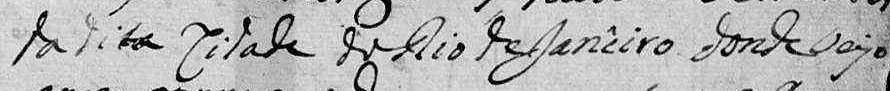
da dita Cidade do Rio de Janêiro donde veyo
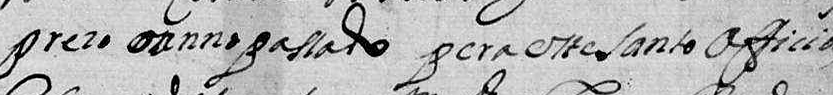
prezo o anno passado pera este santo officio,
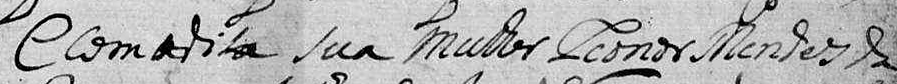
E com a dita sua mulher Leonor Mendes da
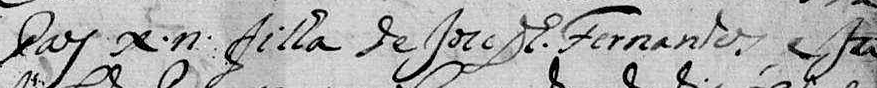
Pas x. n. filha de Jozeph. Fernandos, e Jza
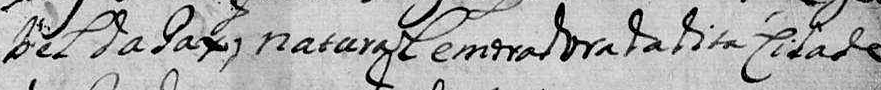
bel da Pax, natural e moradora da dita Cidade
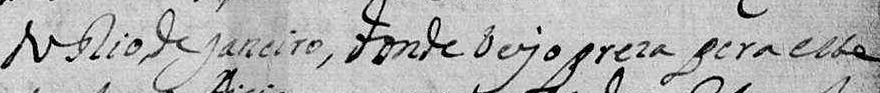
do Rio de janeiro, donde vejo preza pera este
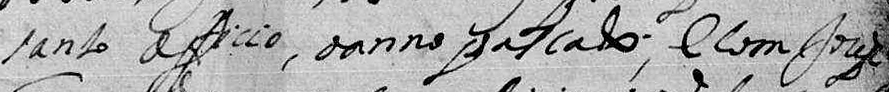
santo officio, o anno pascado. e com Jozep
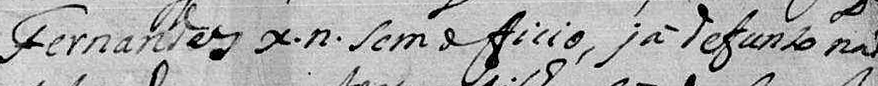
Fernandes x. n. sem officio, já defunto naõ
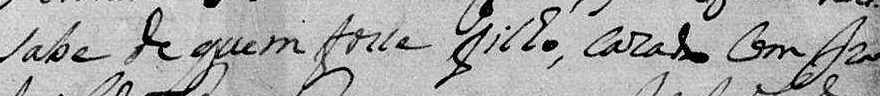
sabe de quem fosse filho cazado com Jza
